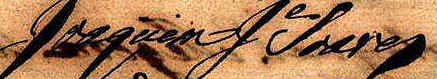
Joaquim J.e Soares
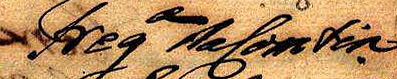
Freg.a da Comtin
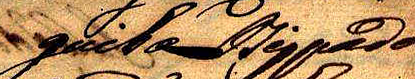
guiba Bispado
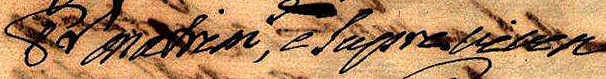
Pr.o Matrimo, e Supreviven
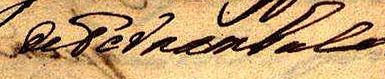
de PernambuCo
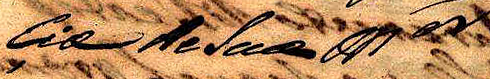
Çia de Sua Mer
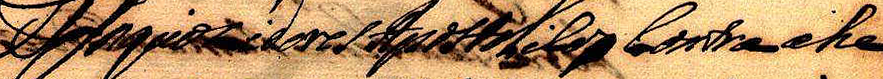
OS Jnquizidores ApostoLiCos Contra a he
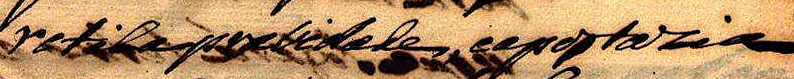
retiCa pravidade, e apostazia
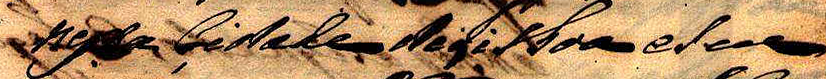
nesta Çidade de Lisboa e seu
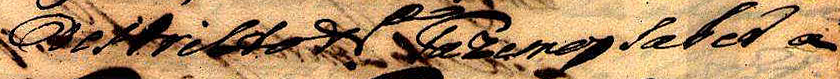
destriCto &ra Fazemos saber a
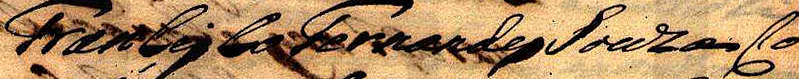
FranÇisCo Fernandes Souza Co
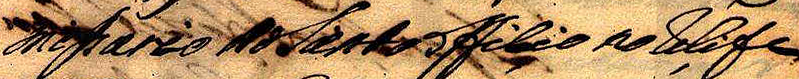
missario do Santo offiçio no ReÇife
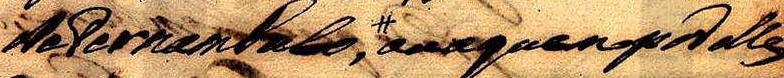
de PernambuCo, #ou a quem por elle
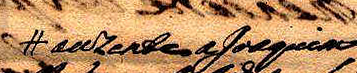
# auZente a Joaquim
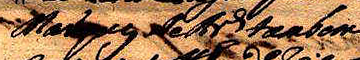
Marques de Ar.o tambem
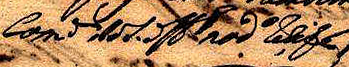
Como do s. offo no d.o ReÇife
